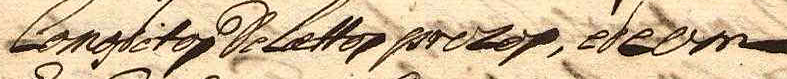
Com os ditos DeLattos prezos, e de vm
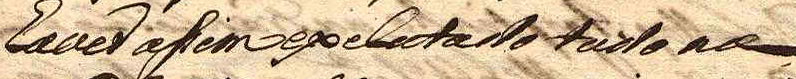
haver assim exeCutado tudo na
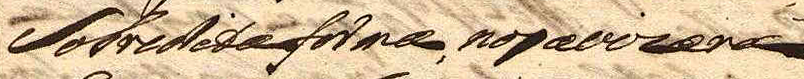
Sobredita forma, nos avizará
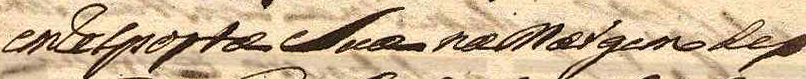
em Resposta Sua na Margem des
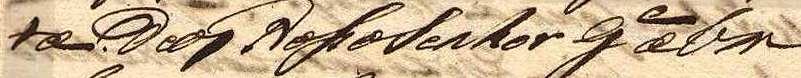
ta. Deos Nosso Senhor Ge a vm
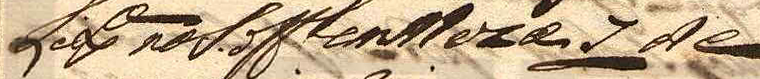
Lixa no S. offo em Meza 7 de
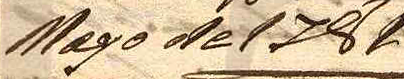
Mayo de i78i
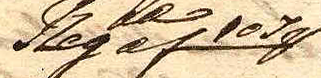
Regda a fl.107v
